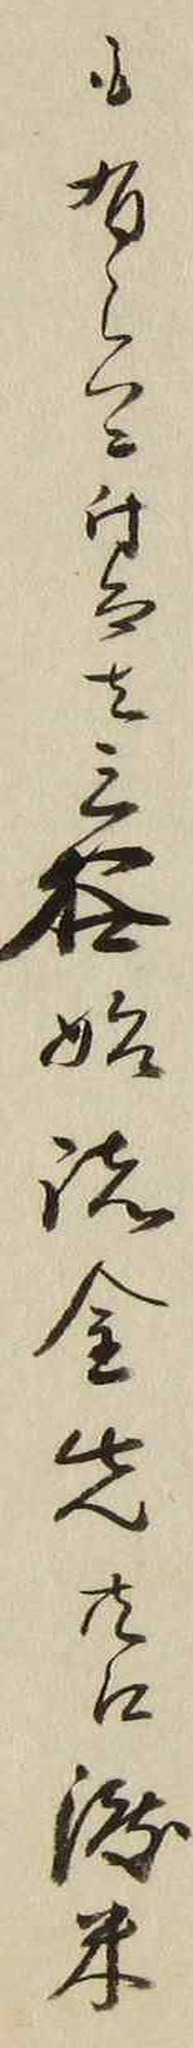も有之候ニ付而者三谷始諸金先共江渡米
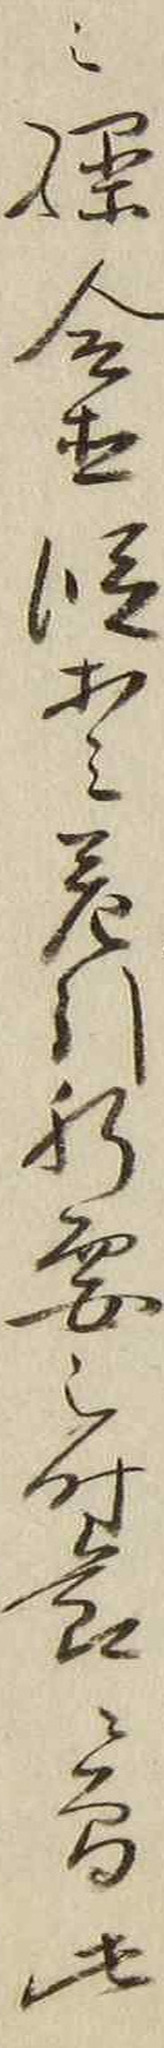之繰合直段等之差引肝要之時節ニ候間此
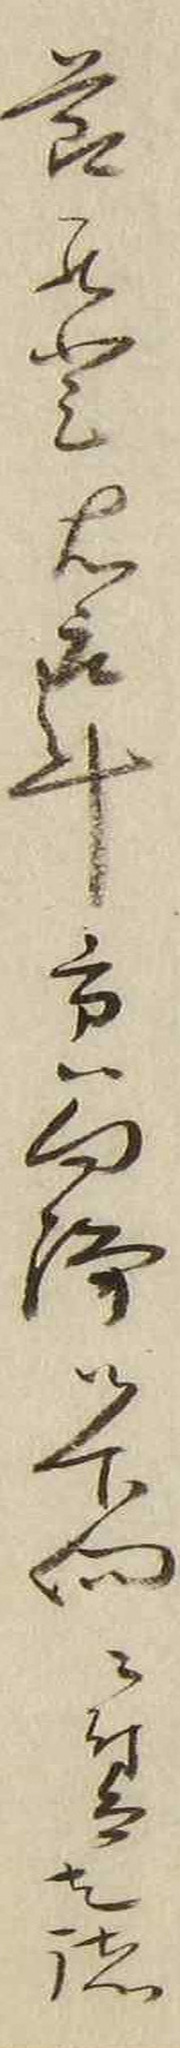節罷登右取計方ハ勿論御下向ニ付而者諸

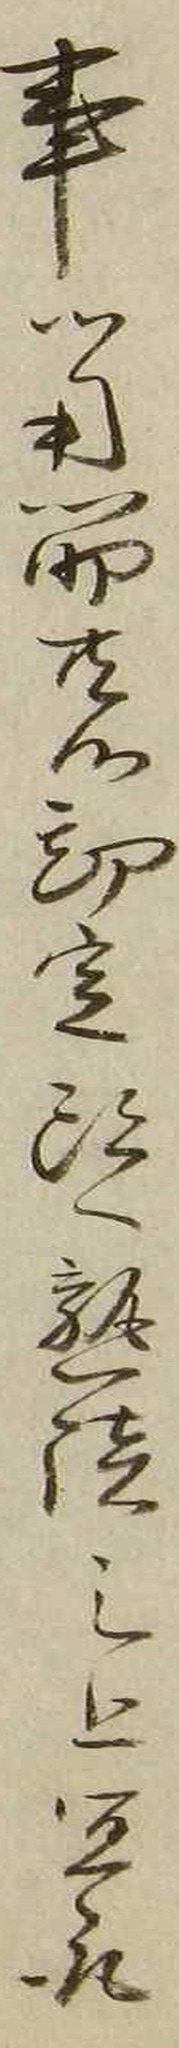事御用筋共御勘定頭へ熟談之上宜取
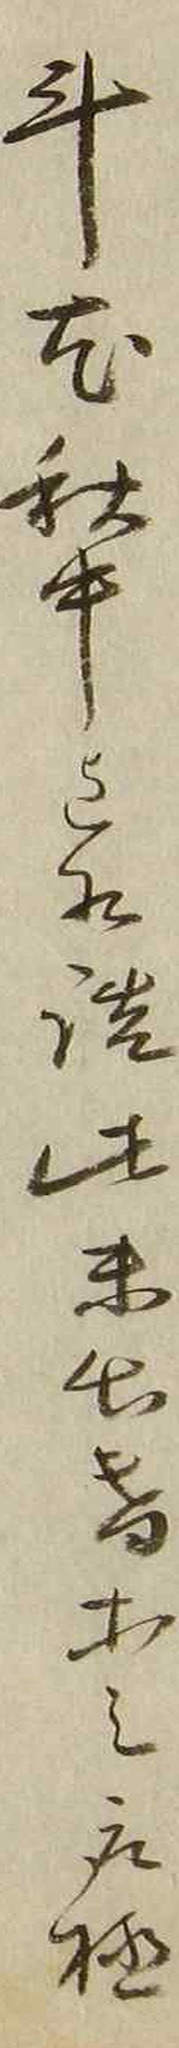計尤秋中迄相詰此未出替等之取極
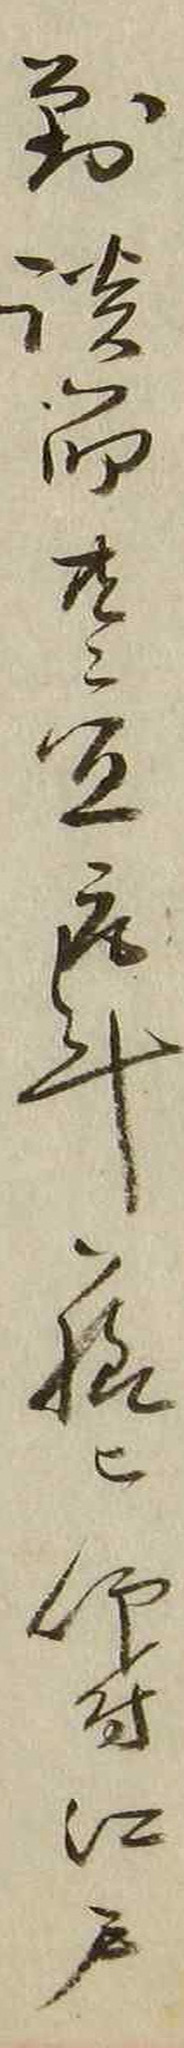対談筋共ニ宜取計候様被仰付江戸
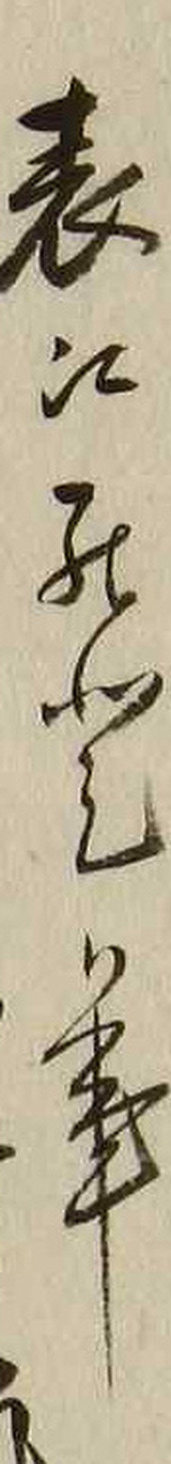表江罷登候事
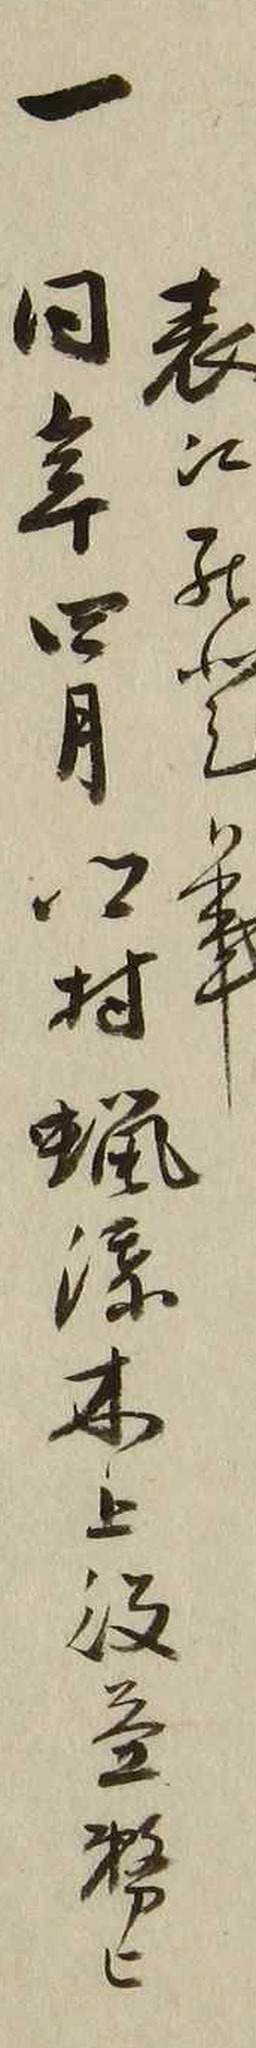一同年四月郷村蝋添木上役兼務被
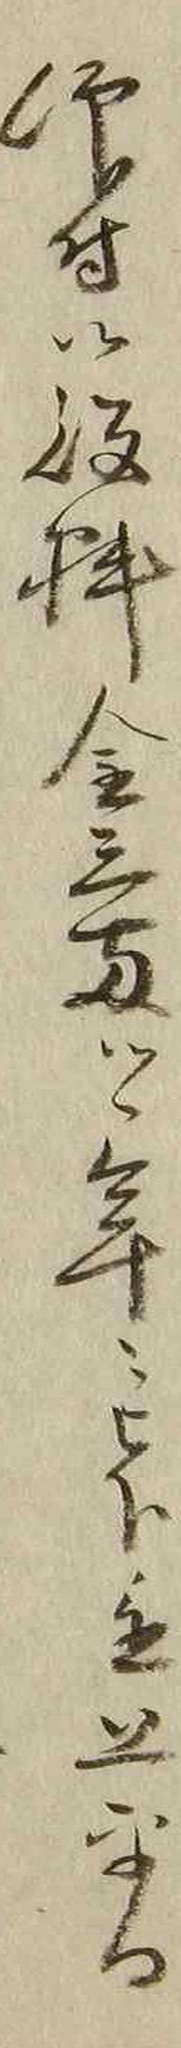仰付御役料金三両ツヽ年ニ被下置且平日
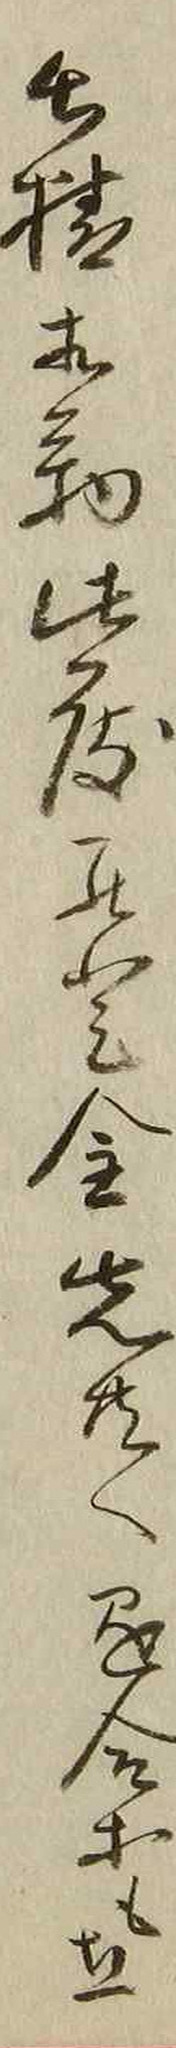出精相勤此度罷登金先共へ懸合等も直
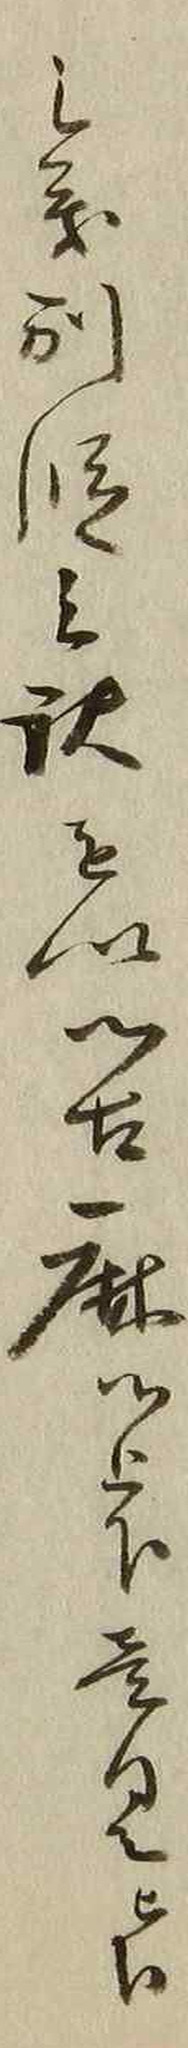之義別段之訳も以御古麻御上下壱具被下
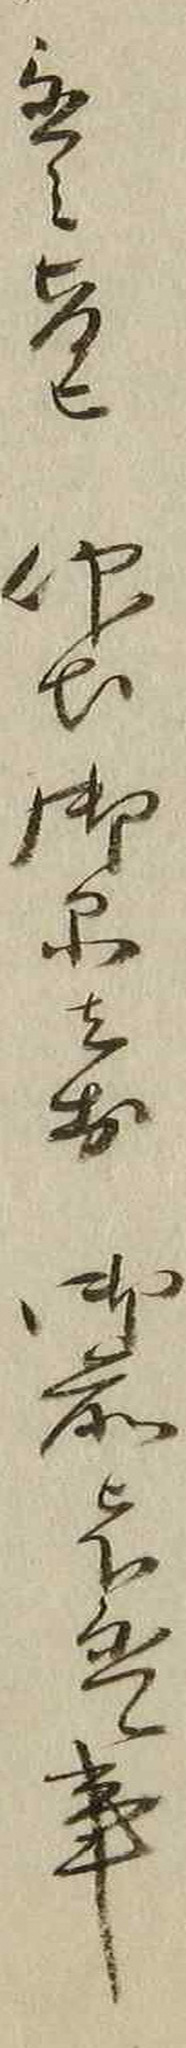置之旨被仰出御品を於御前被下置候事
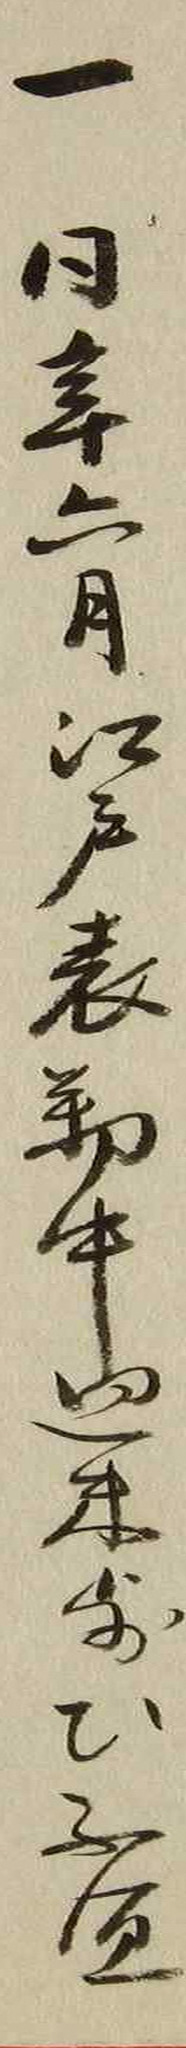一同年六月江戸表勤中廻米歩ひ不宜
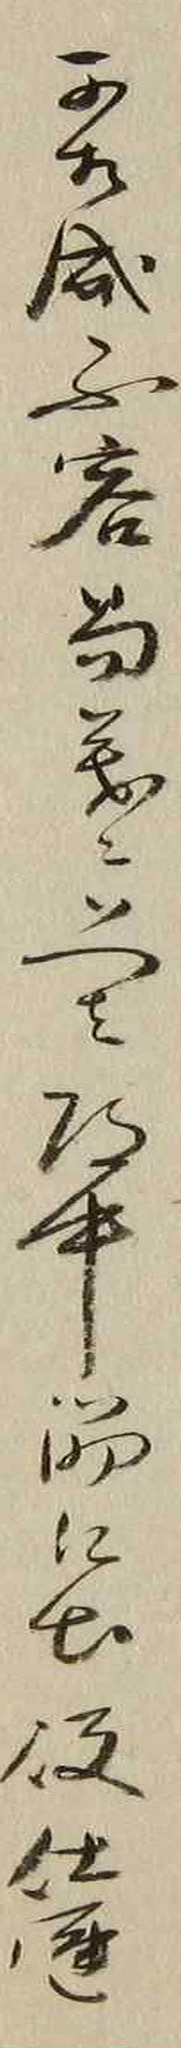可相成不容易義候へ者道中筋江出役仕運
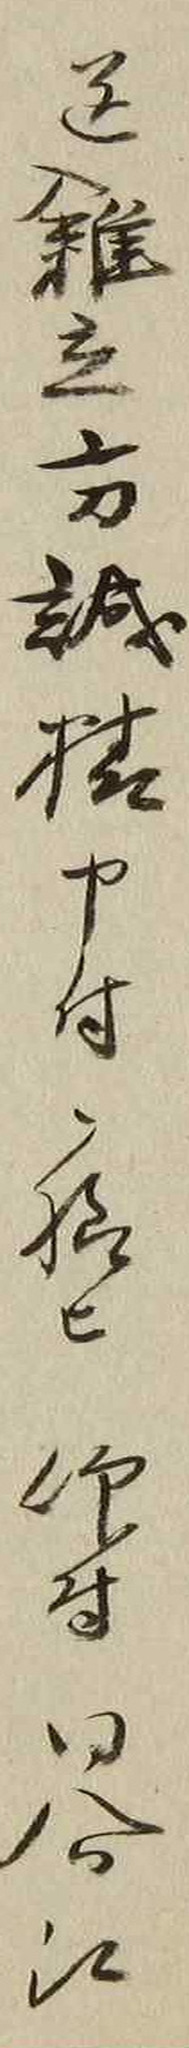送雑立方誠精申付候様被仰付同八日江
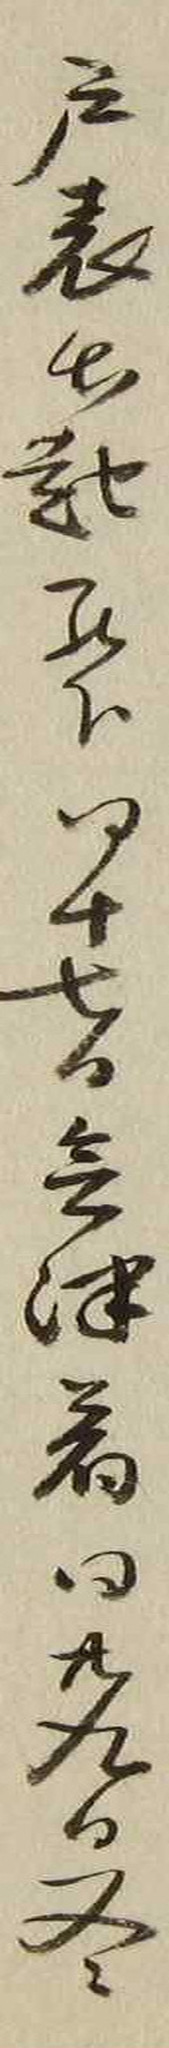戸表出起罷下同十七日会津着同廿九日又々
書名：諸士系譜　巻之311　し之部1
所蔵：会津若松市立会津図書館
